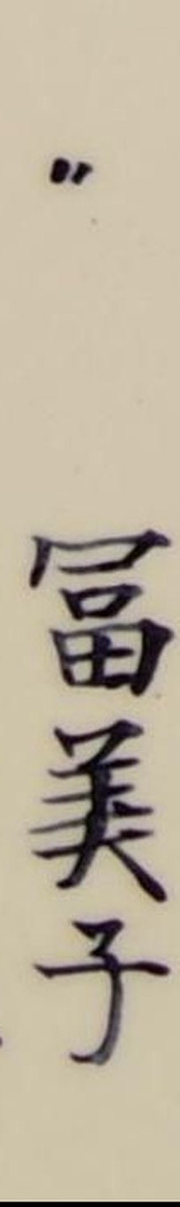冨美子
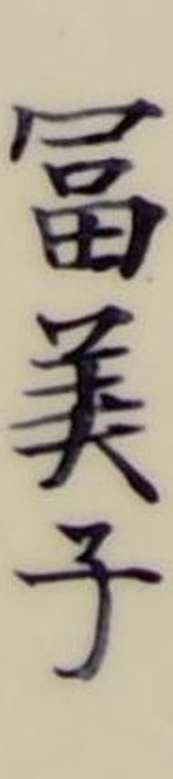冨美子
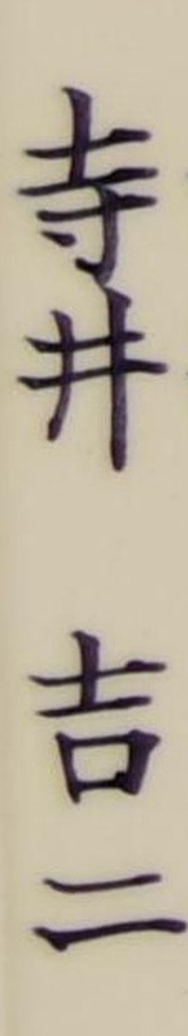寺井吉二

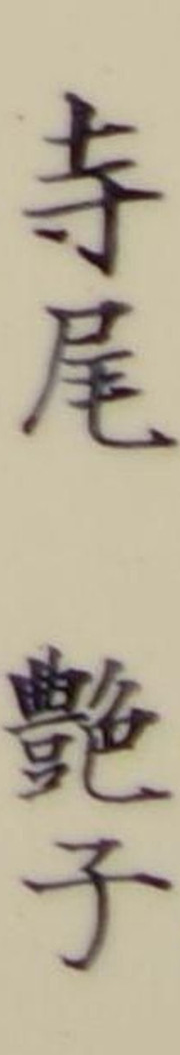寺尾艶子
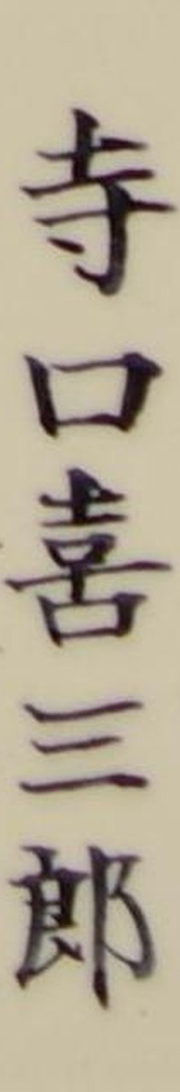寺口喜三郎
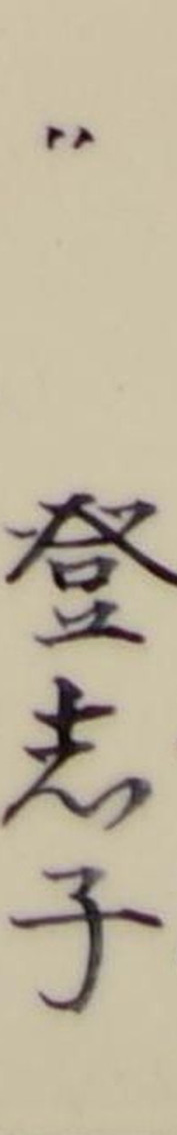登志子
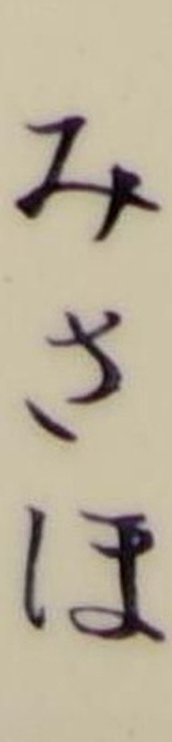みさほ
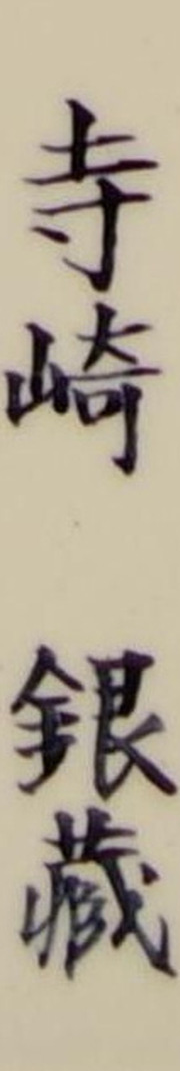寺崎銀蔵
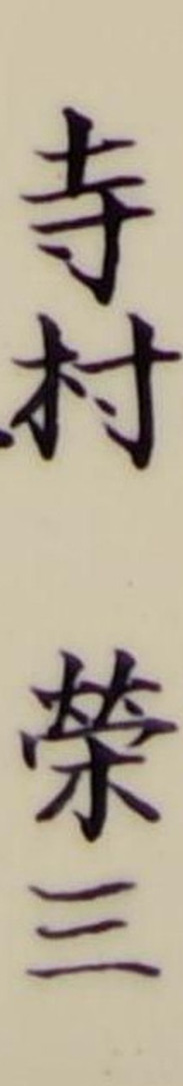寺村榮三
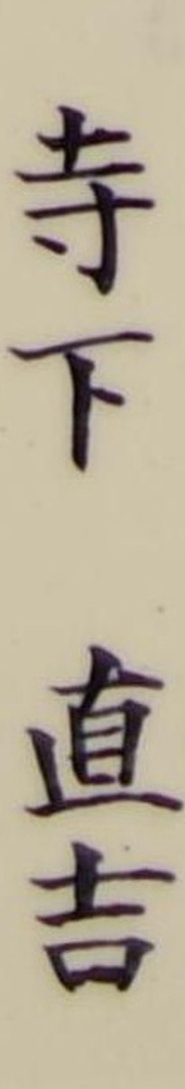寺下直吉
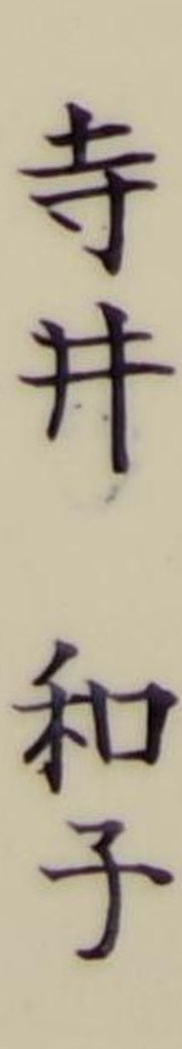寺井和子
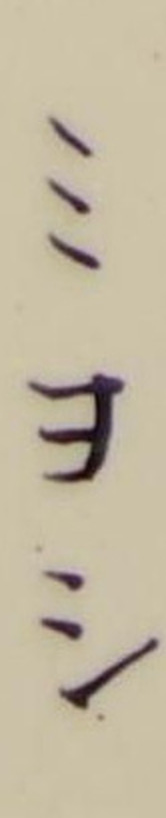ミヨシ
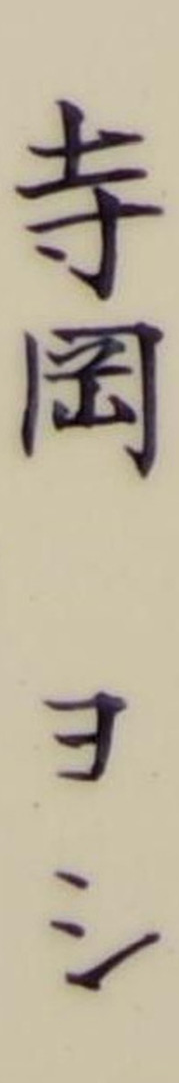寺岡ヨシ
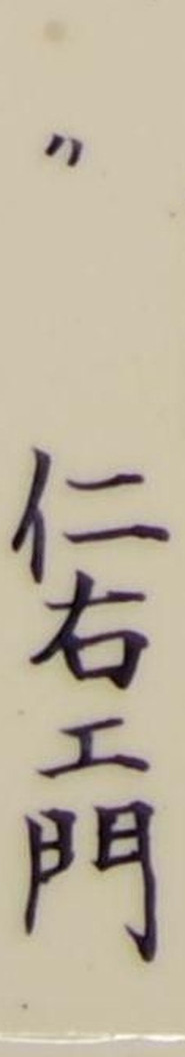仁右衛門
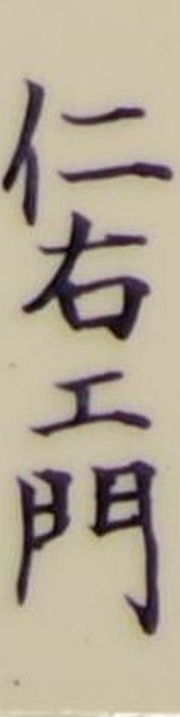仁右衛門
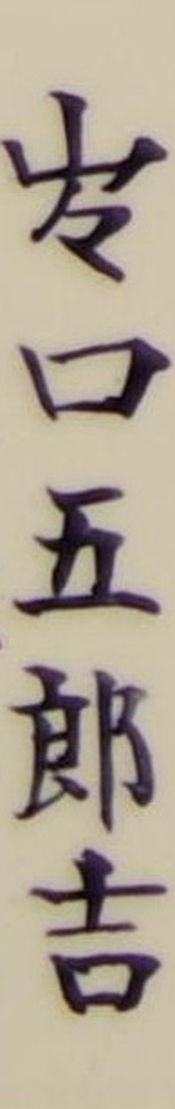㞮口五郎吉
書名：E~L
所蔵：高野山金剛峯寺
